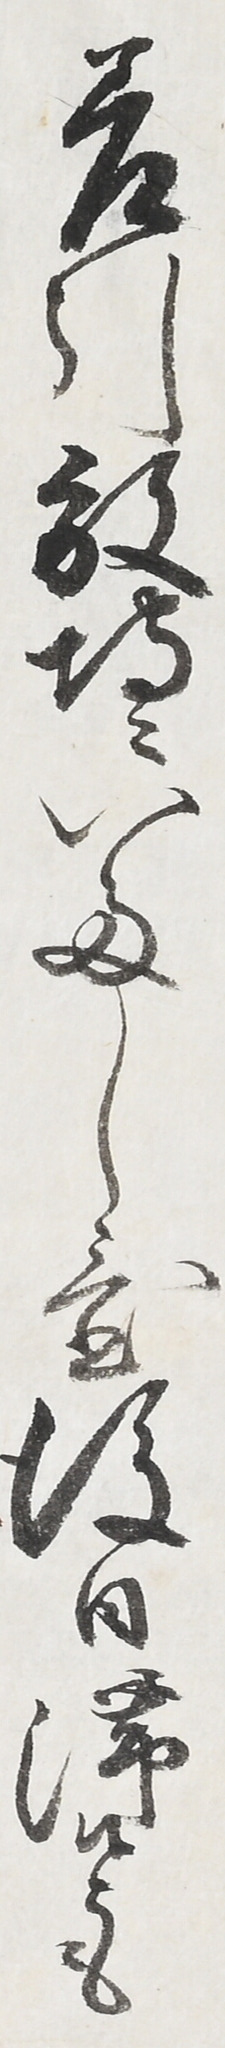差引放埒ニいたし置後日滞候とも
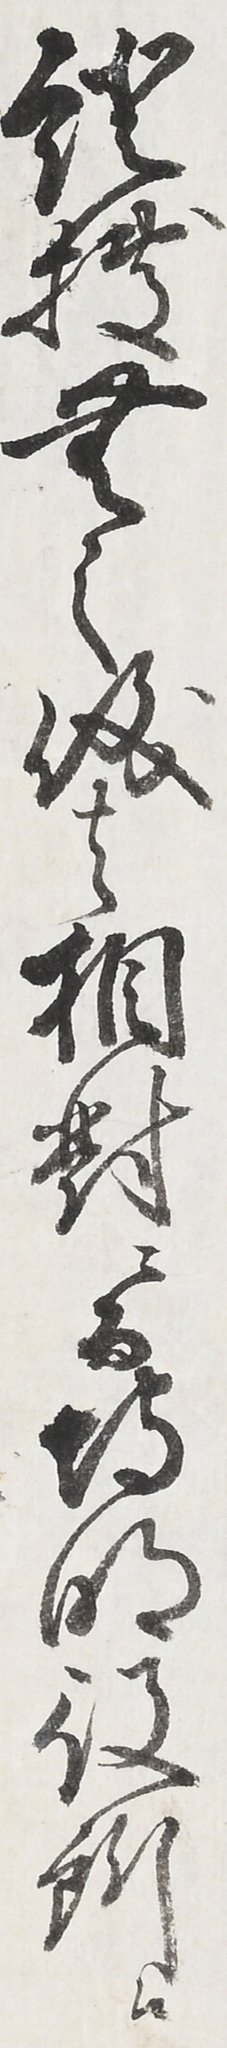証拠無之儀者相対ニ而埒明役所江
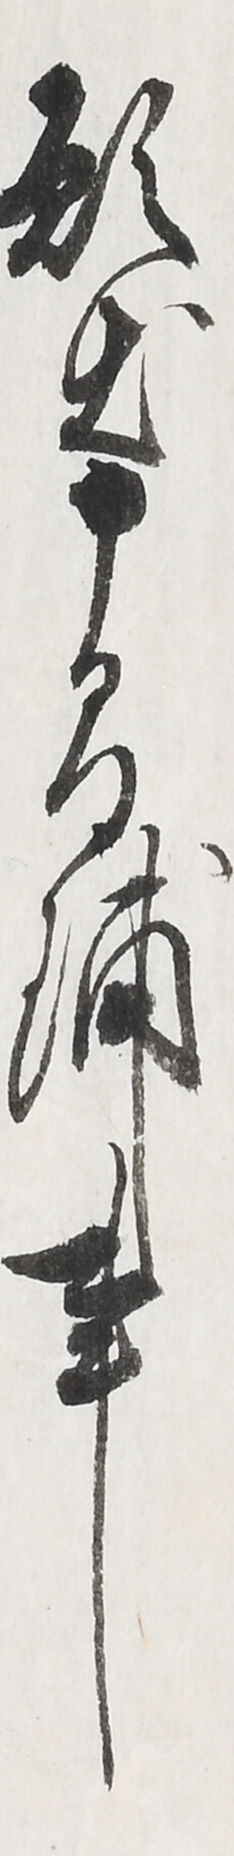願出申間敷事
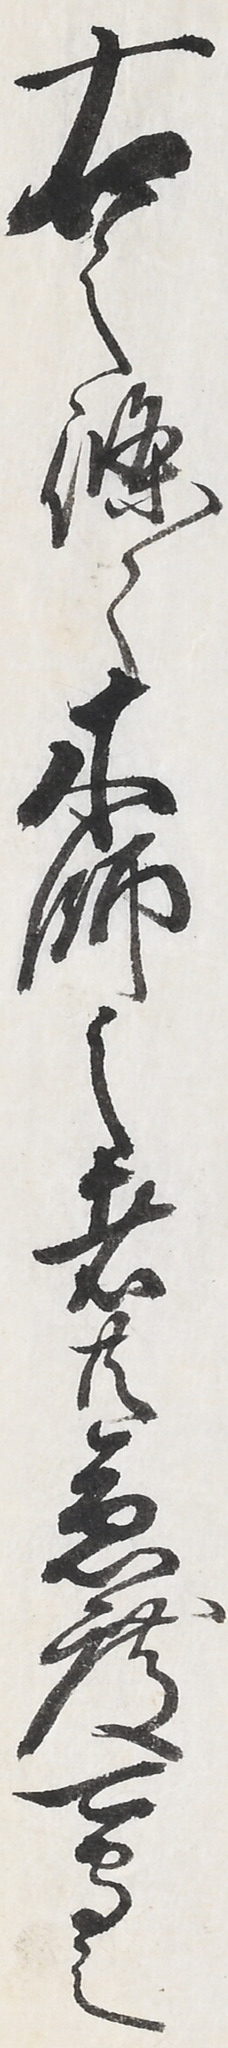右之條々木師之者共急度可守之
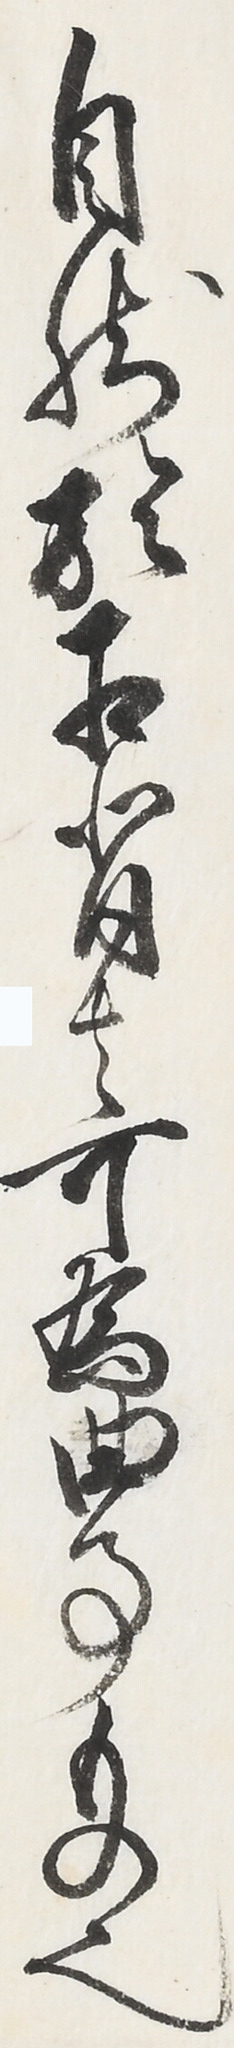自然於相背者可為曲事もの也
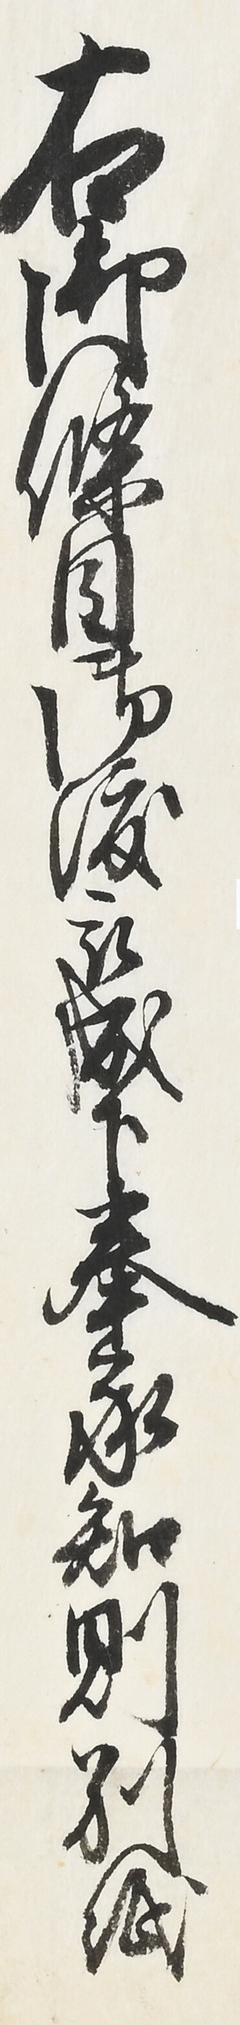右御條目御渡被成下奉承知則別紙
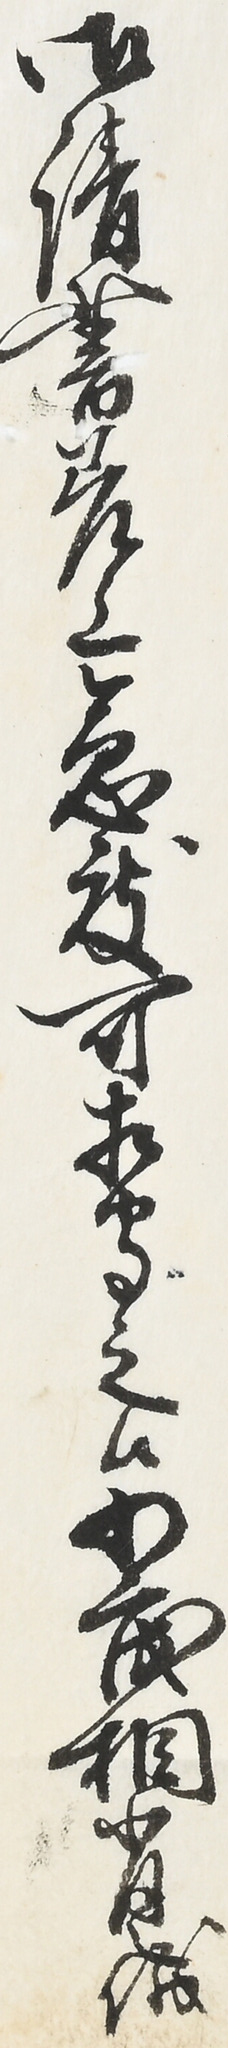請書差上急度可相守之候少茂相背儀

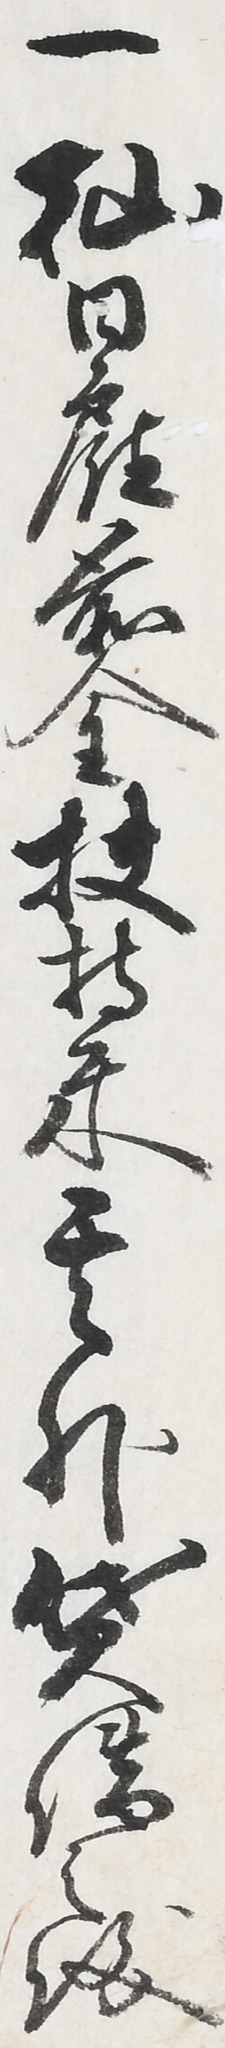一杣日雇前金扶持米其外貸借之儀
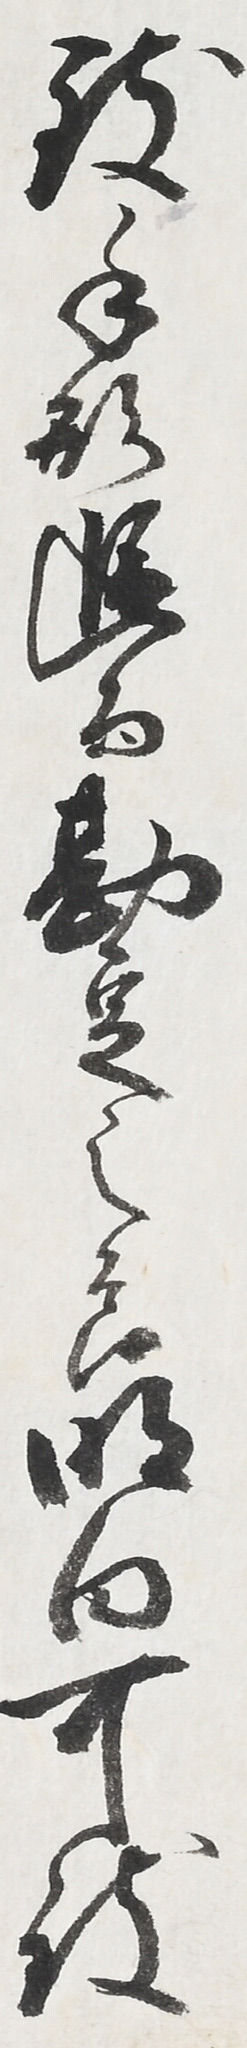致手形追而勘定之節明白可致
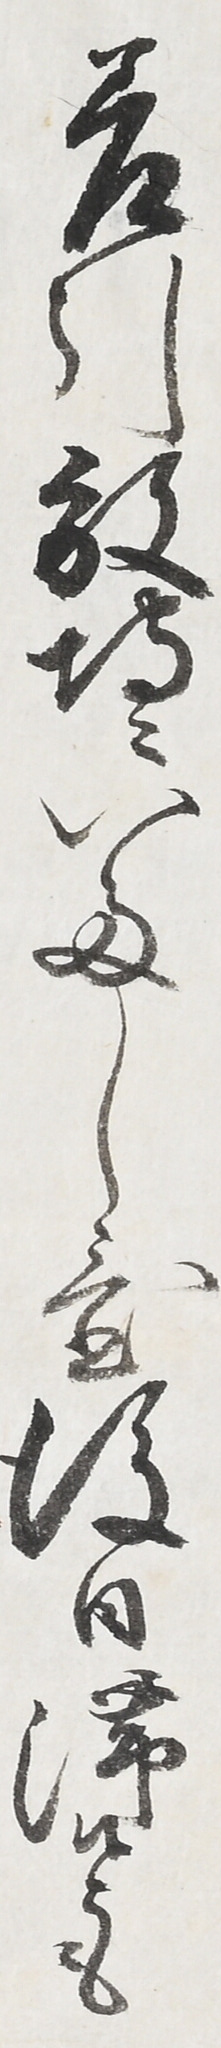差引放埒ニいたし置後日滞候とも
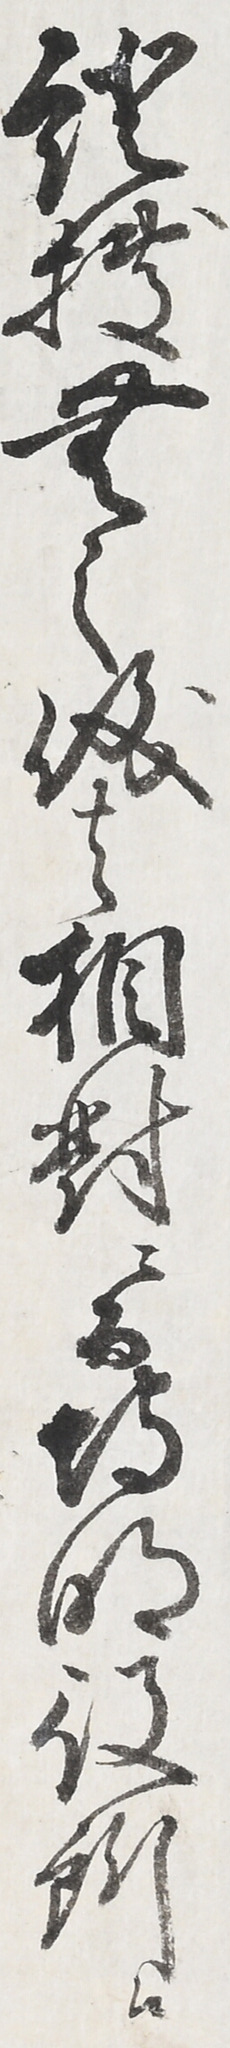証拠無之儀者相対ニ而埒明役所江
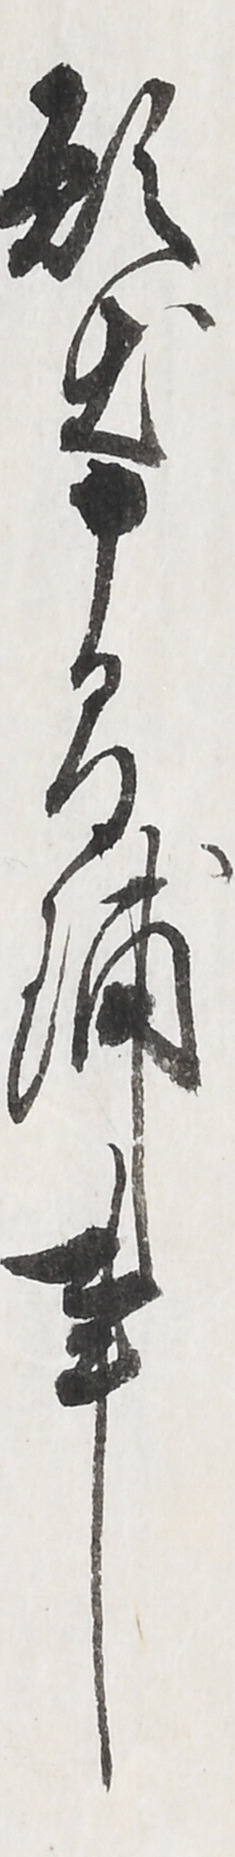願出申間敷事
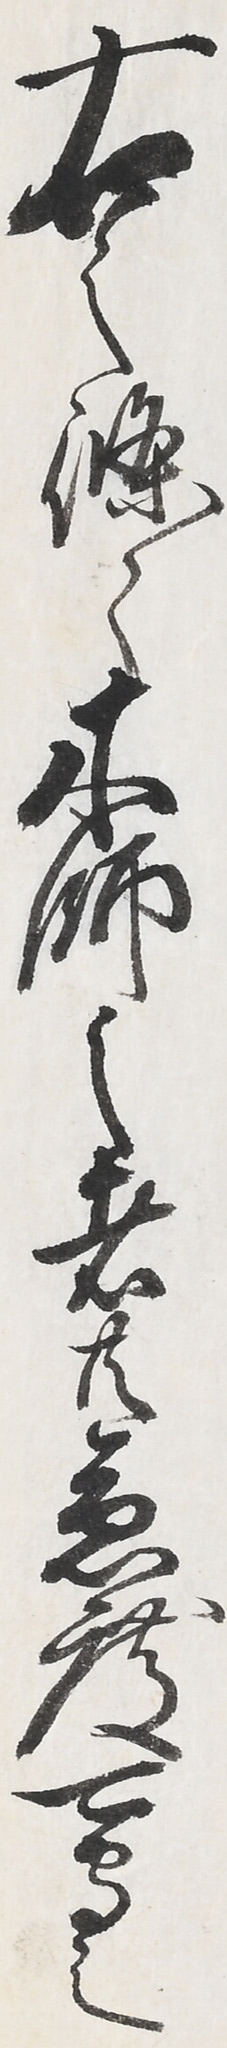右之條々木師之者共急度可守之
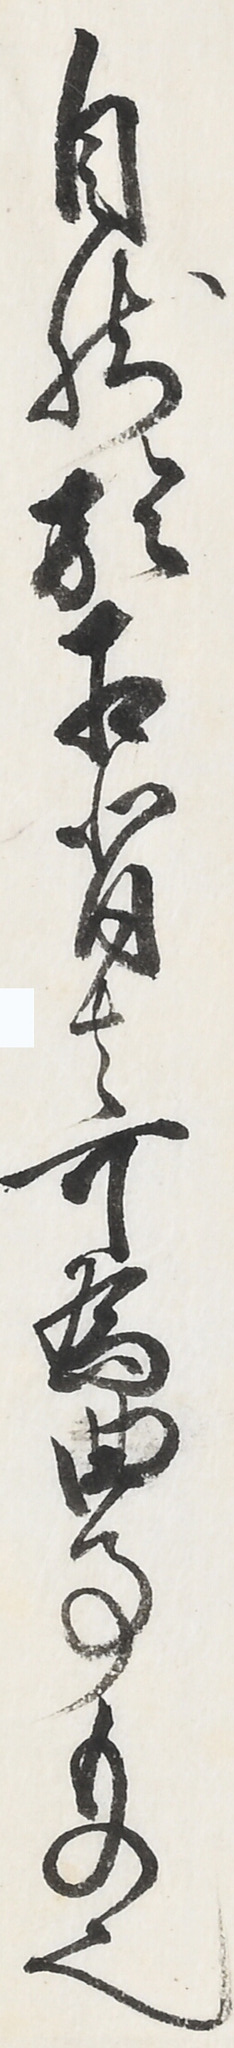自然於相背者可為曲事もの也
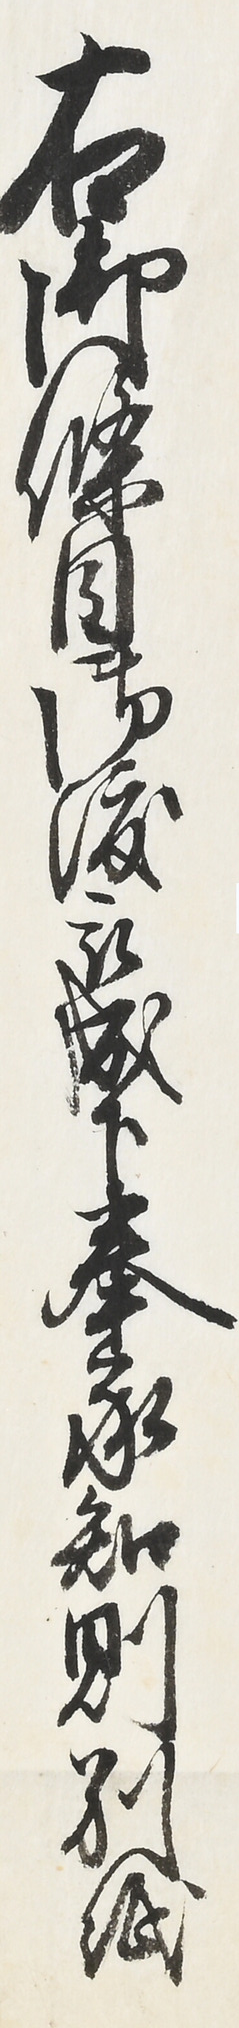右御條目御渡被成下奉承知則別紙
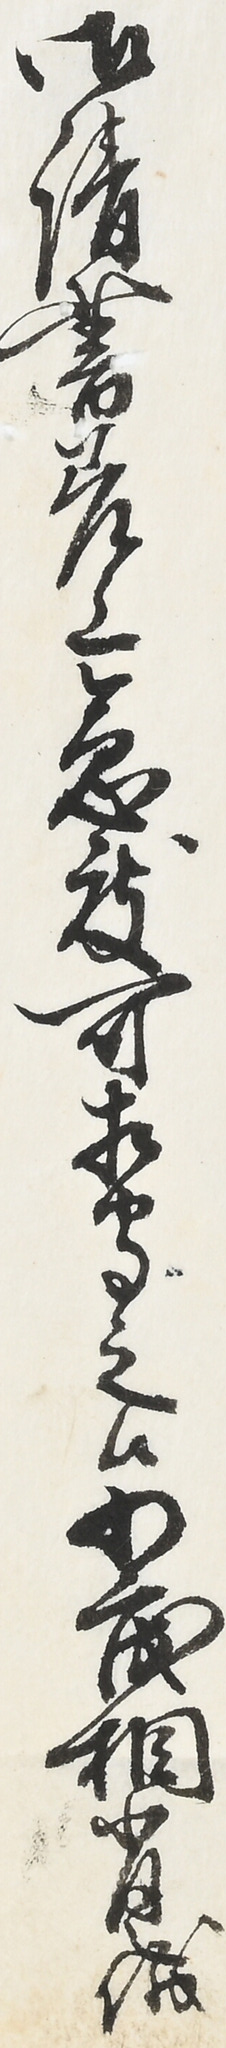請書差上急度可相守之候少茂相背儀
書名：小白木條目請書并判取帳
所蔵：伊那市立高遠町図書館・合同会社AMANE
